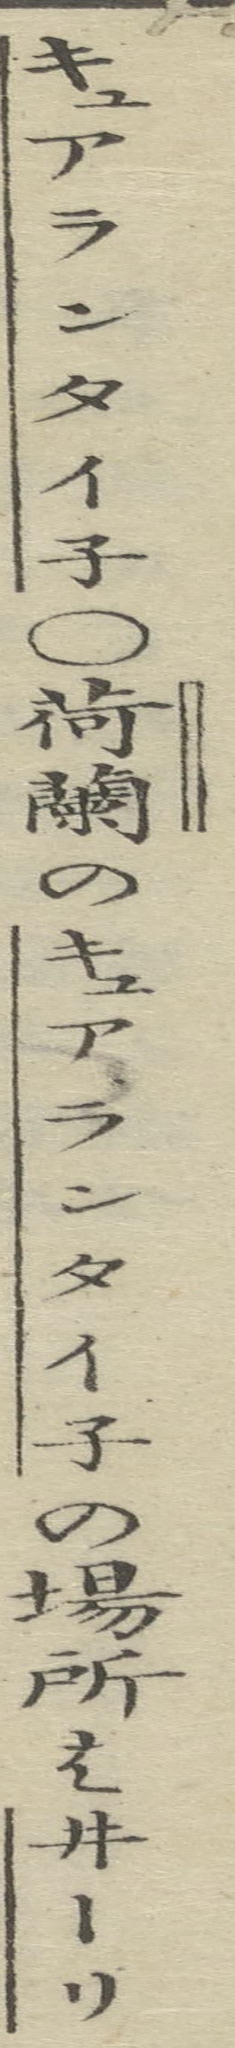キュアランタイニ〇荷蘭のキュアランタイニの場所はイーリ
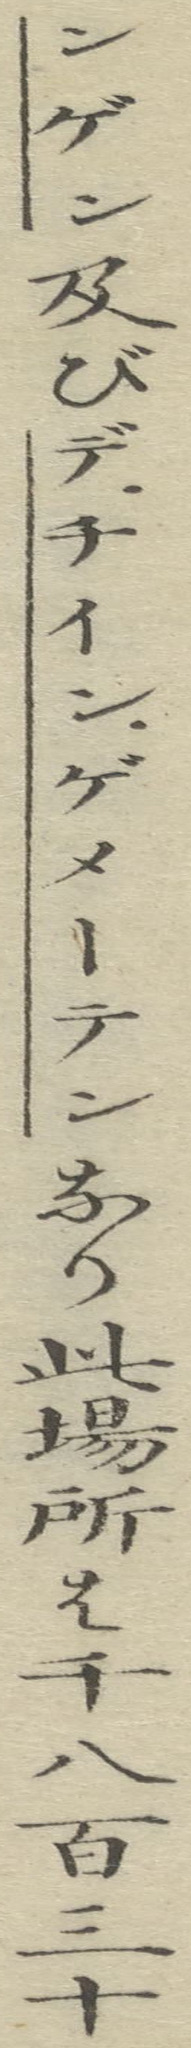ンゲン及びデ、チイン、ゲメーテンなり此場所は千八百三十
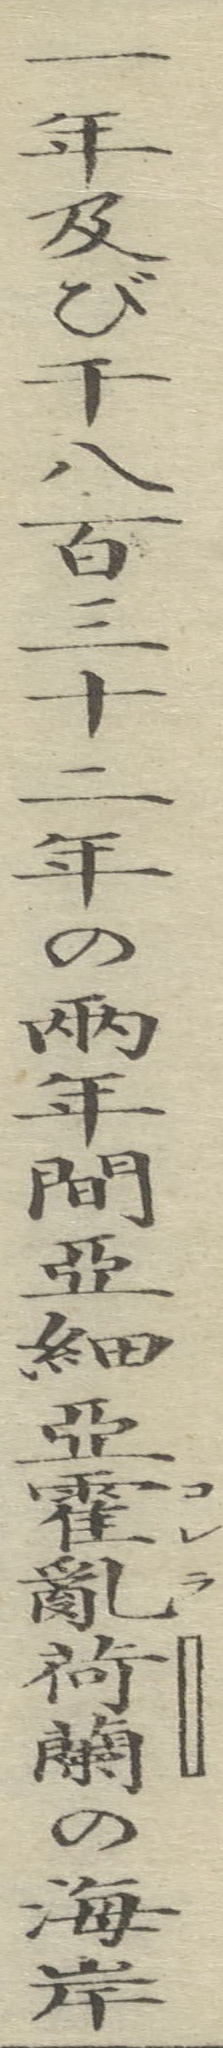一年及び千八百三十二年の両年間亞細亞霍亂荷蘭の海岸
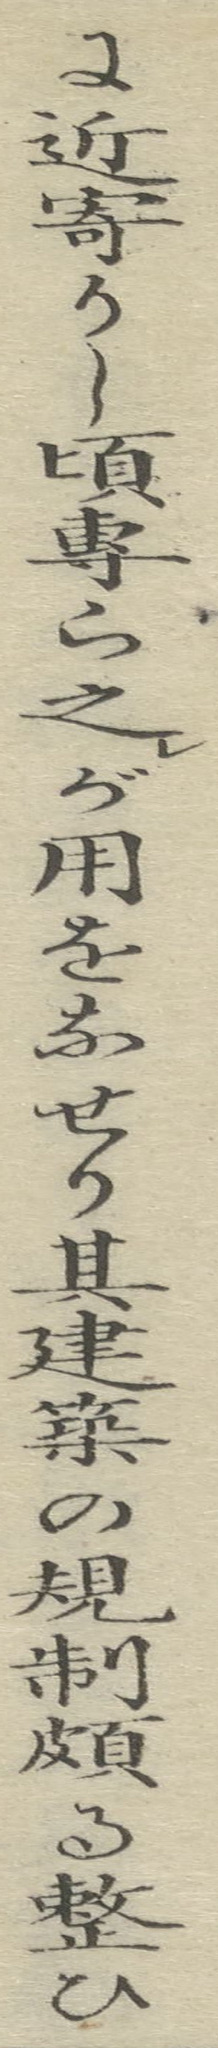に近寄りし頃専ら之用をなせり其建築の規制頗る整ひ
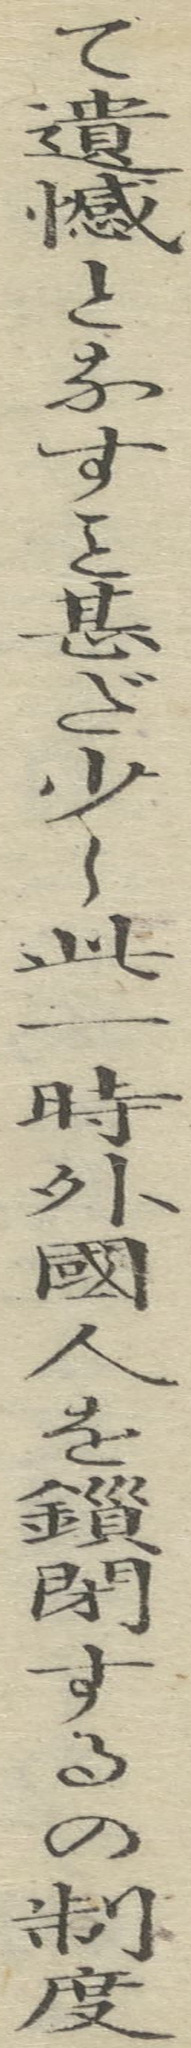て遺憾となすこと甚だ少し此一時外國人を鎖閉するの制度
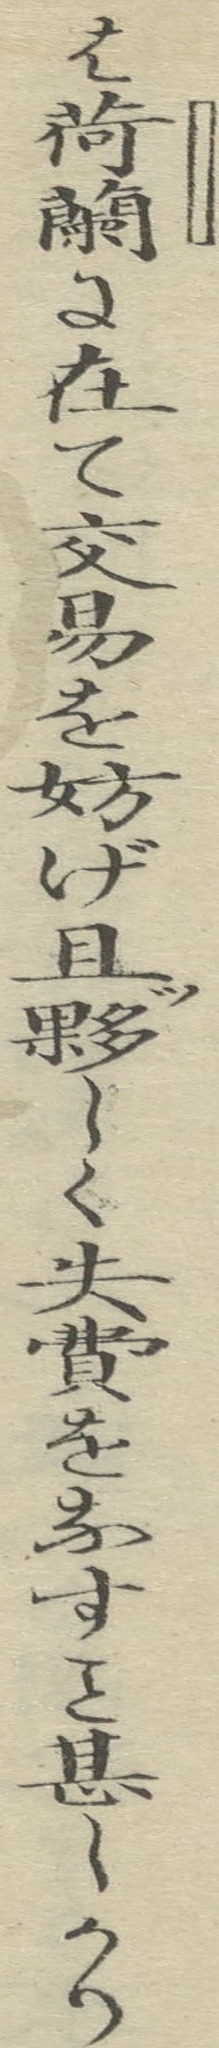は荷蘭に在て交易を妨げ且夥しく失費をなすこと甚しかり
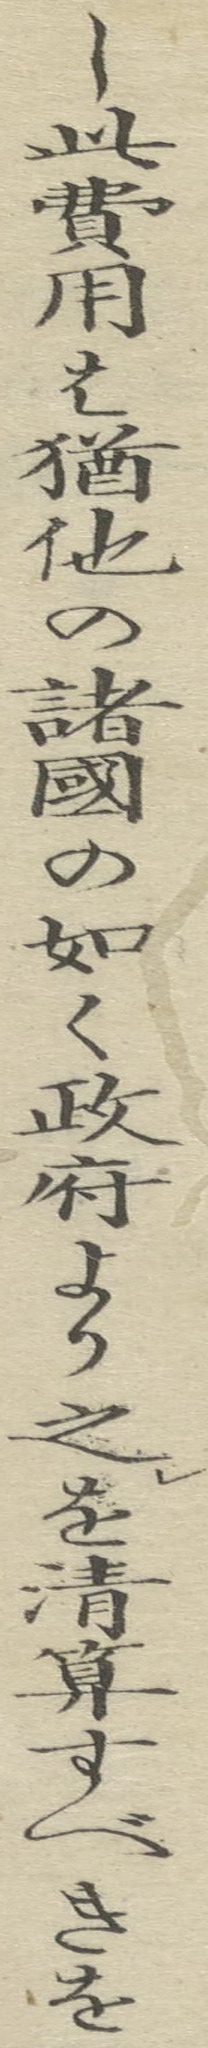し此費用は猶他の諸國の如く政府より之清算すべきを
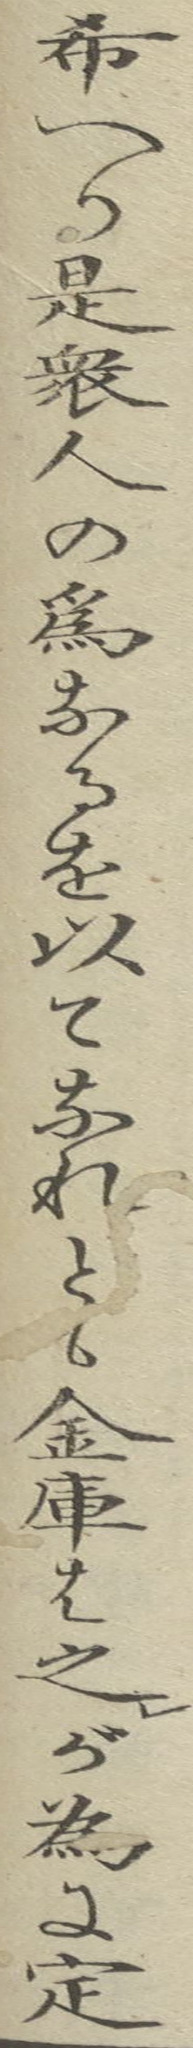希へり是衆人の為なるを以てなれとも金庫は之為に定
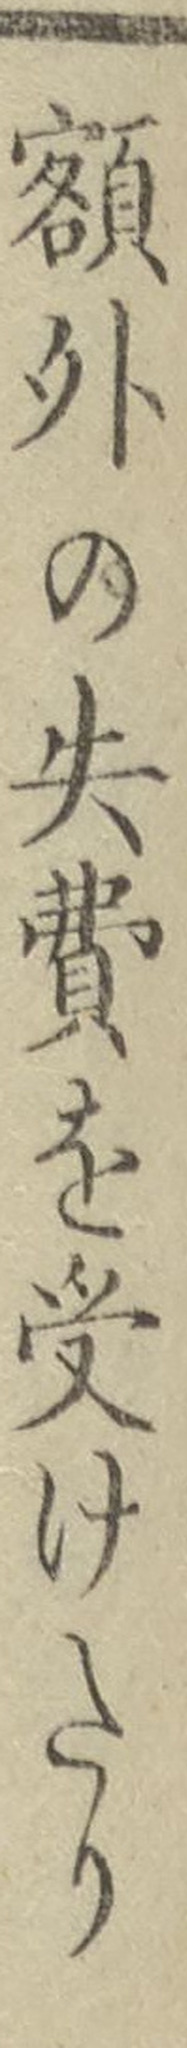額外の失費を受けたり
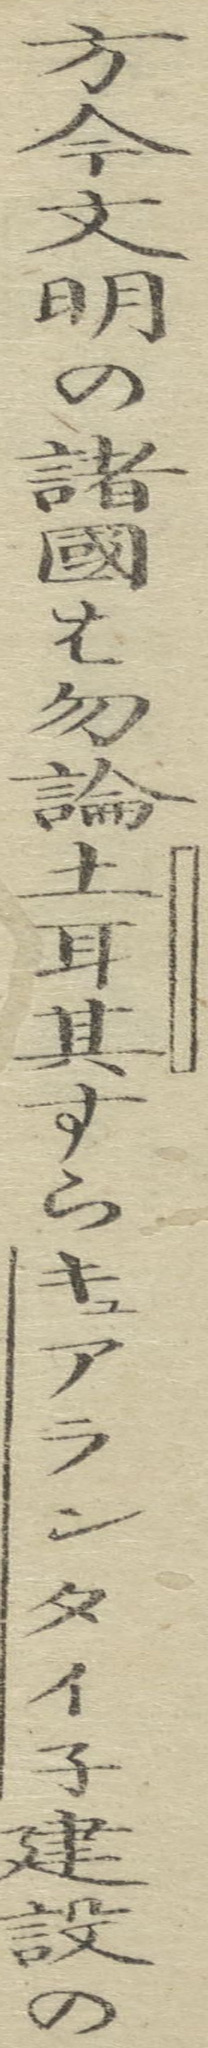方今文明の諸國は勿論土耳其すらキュアランタイニ建設の
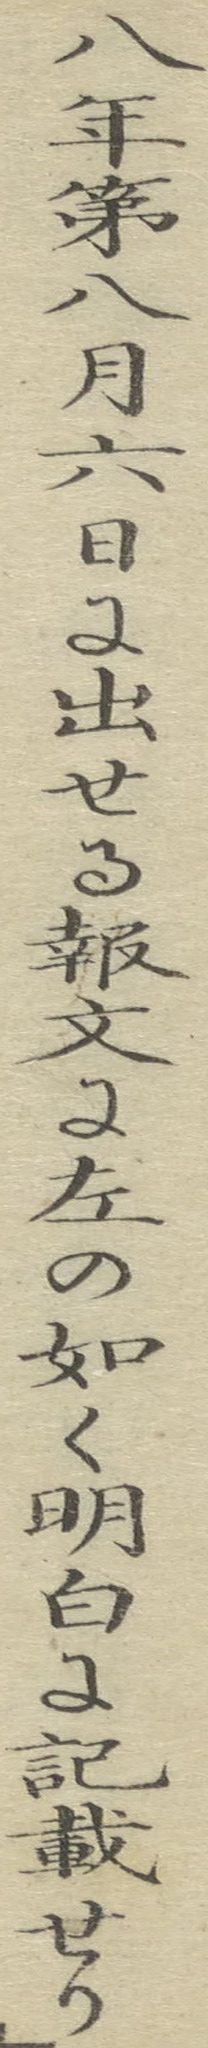八年第八月六日に出せる報文に左の如く明白に記載せり」
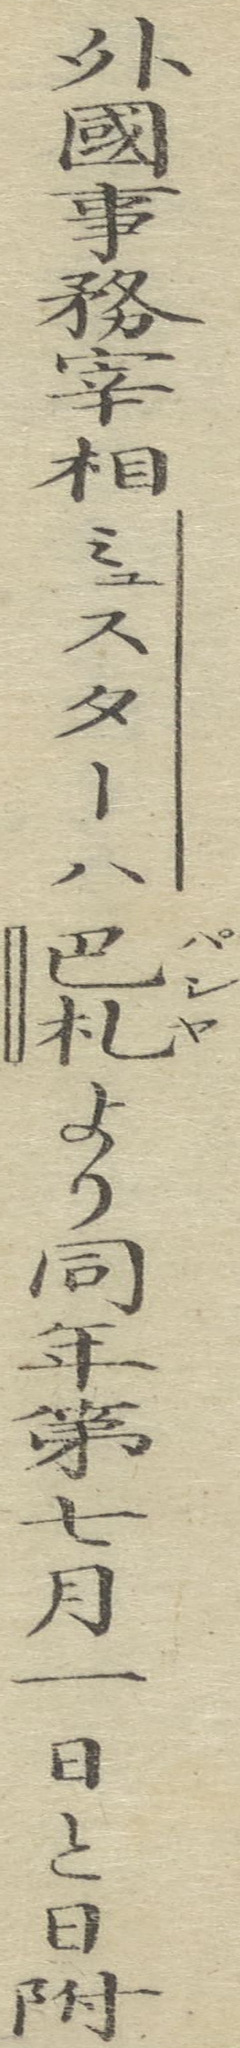外國事務宰相ミュスターハ巴札より同年第七月一日と日附
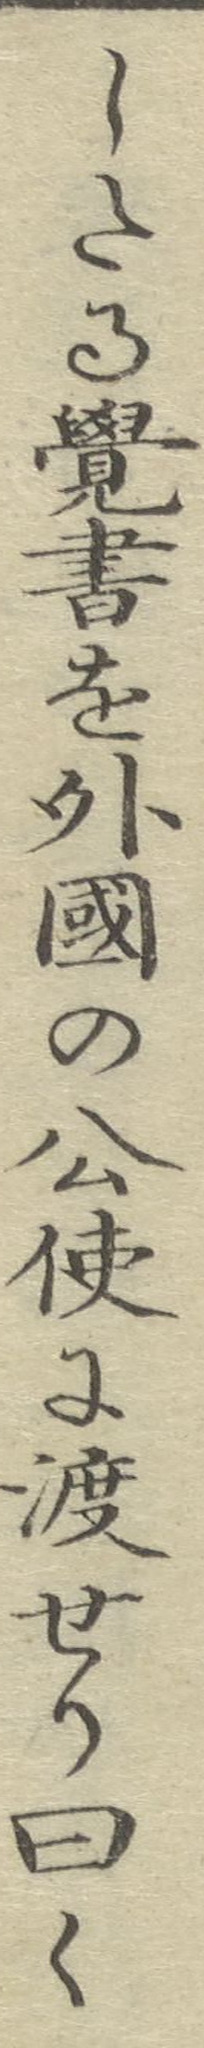したる覚書を外國の公使に渡せり曰く
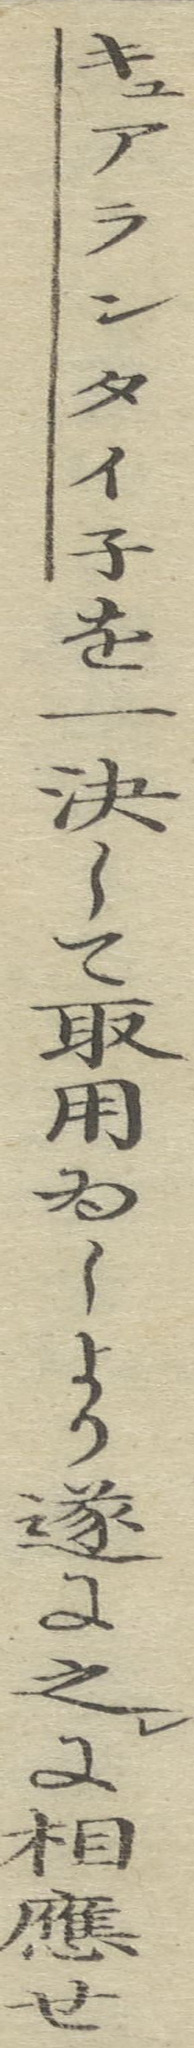キュアランタイニを一決して取用ゐしより遂之相應せ
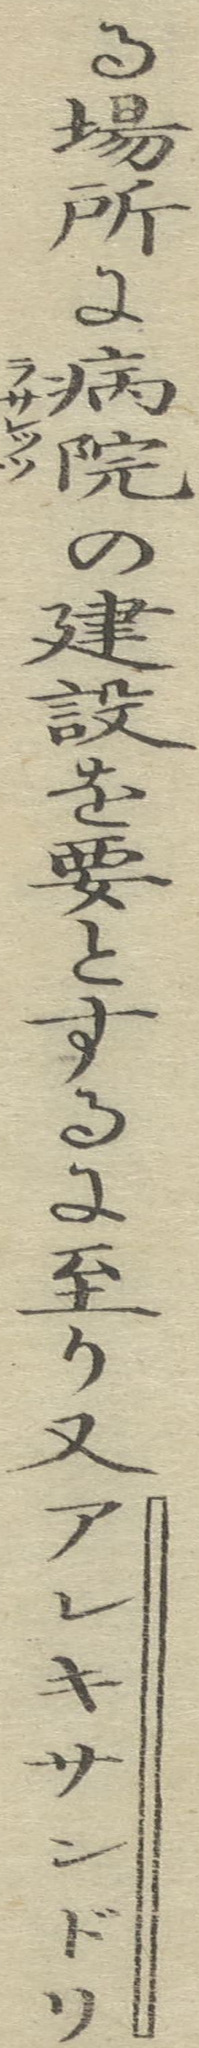る場所に病院の建設を要とするに至り又アレキサンドリ
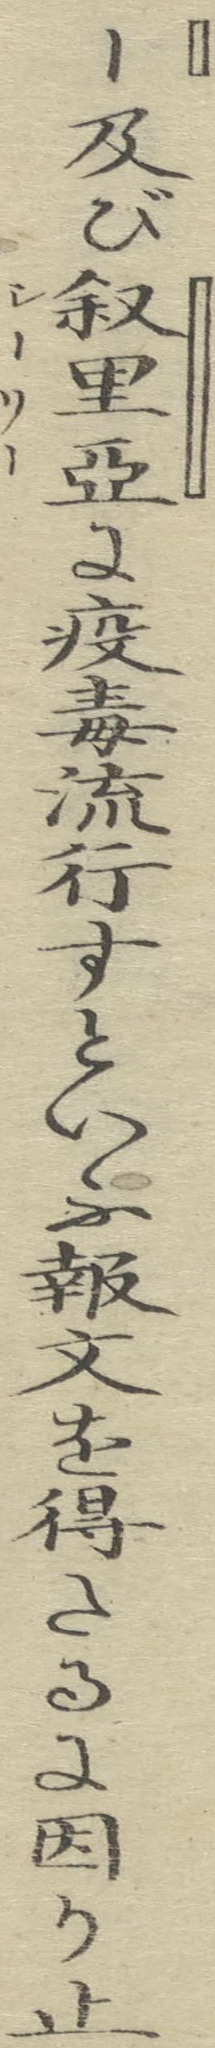―及び叙里亞に疫毒流行するといふ報文を得たるに因り止
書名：官版疫毒預防説　全
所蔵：東京大学総合図書館 General Library in the University of Tokyo, JAPAN
